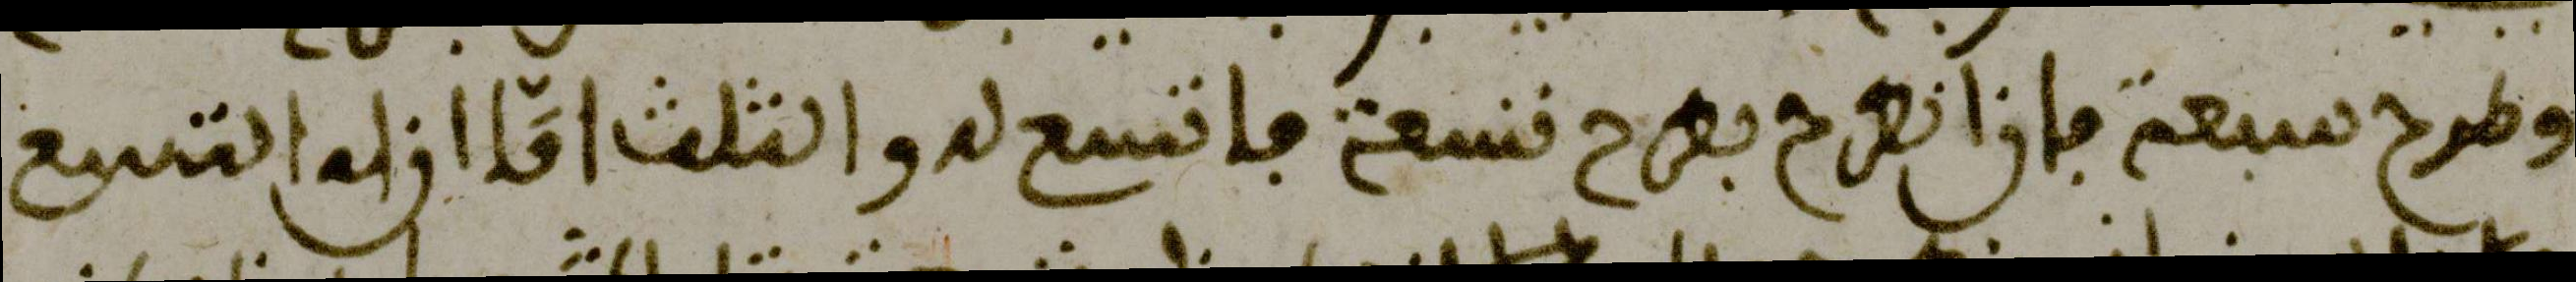وطرح سبعة فان انطرح بطرح تسعة فاتسع له والثلث امّا ان له التسع
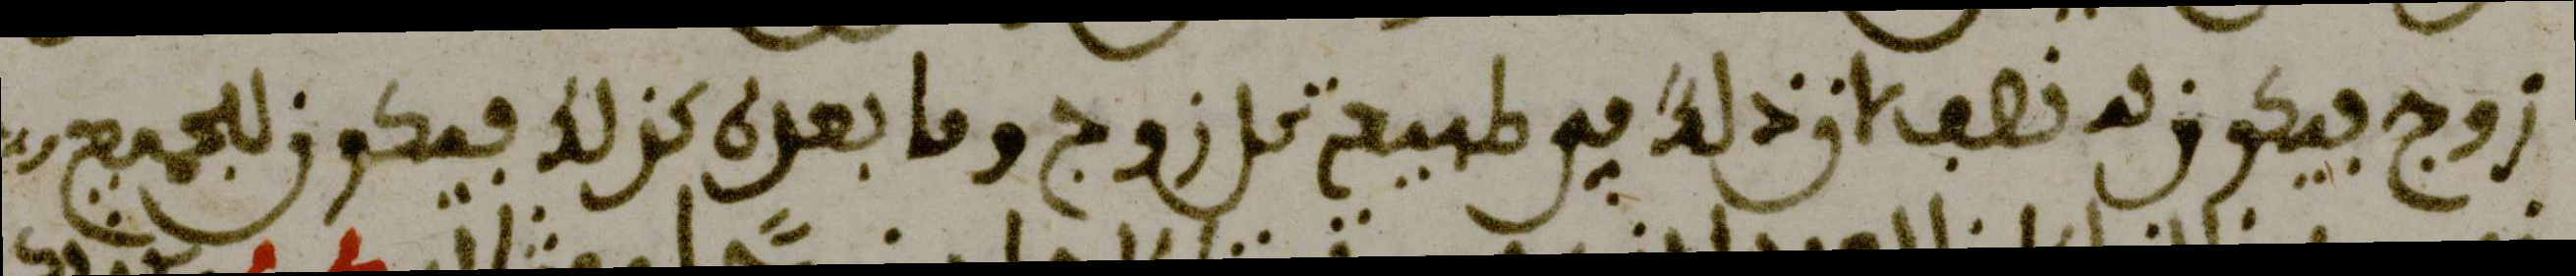زوج فيكون له نصف لان ذلك في طبيعة كل زوج وما بعده كذلك فيكون للجميع
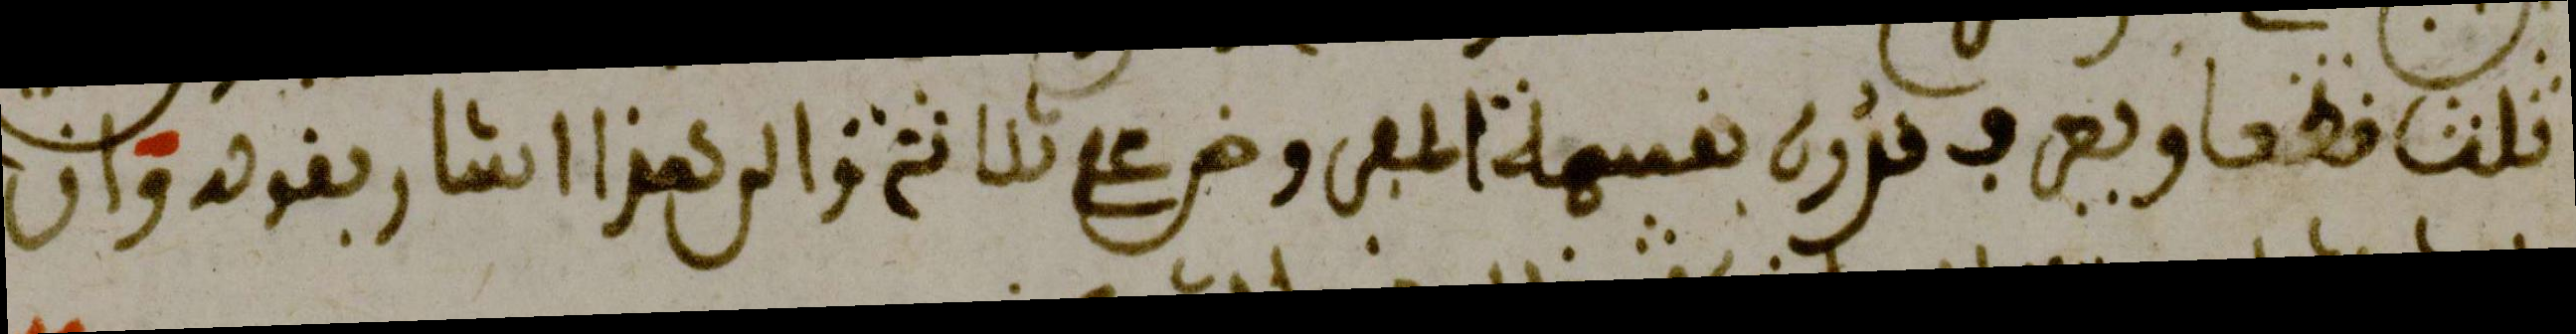ثلث قطعا ويعرف قدره بقسمة المفروض على ثلاثة والى هذا اشار وبقوله وَان
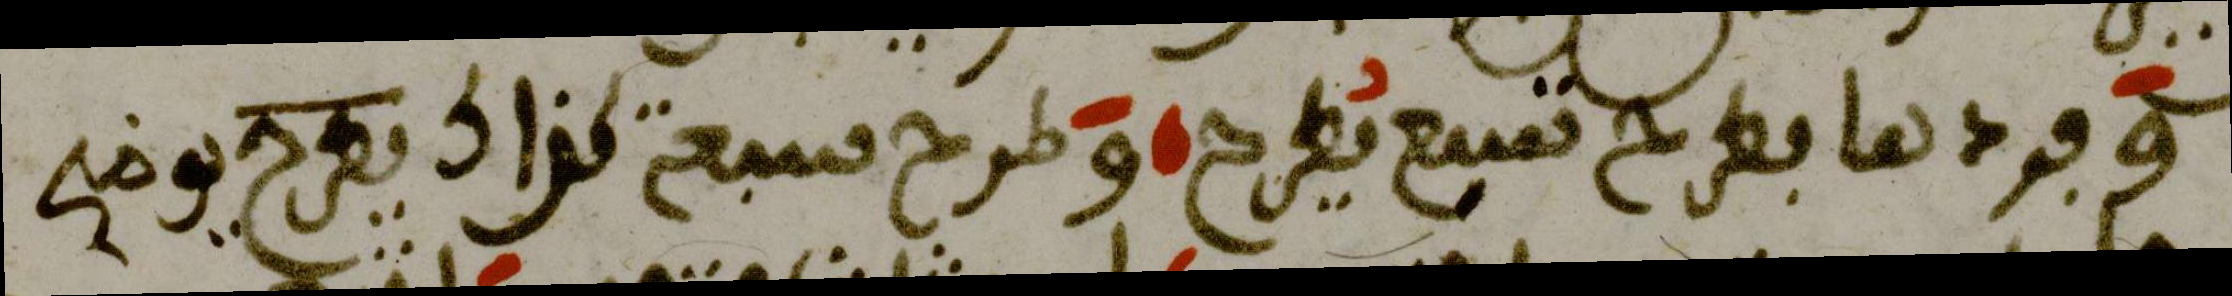وَفردها بطرح تسع يُطرح وَطرح سبعة كذاك يطرح يوضح
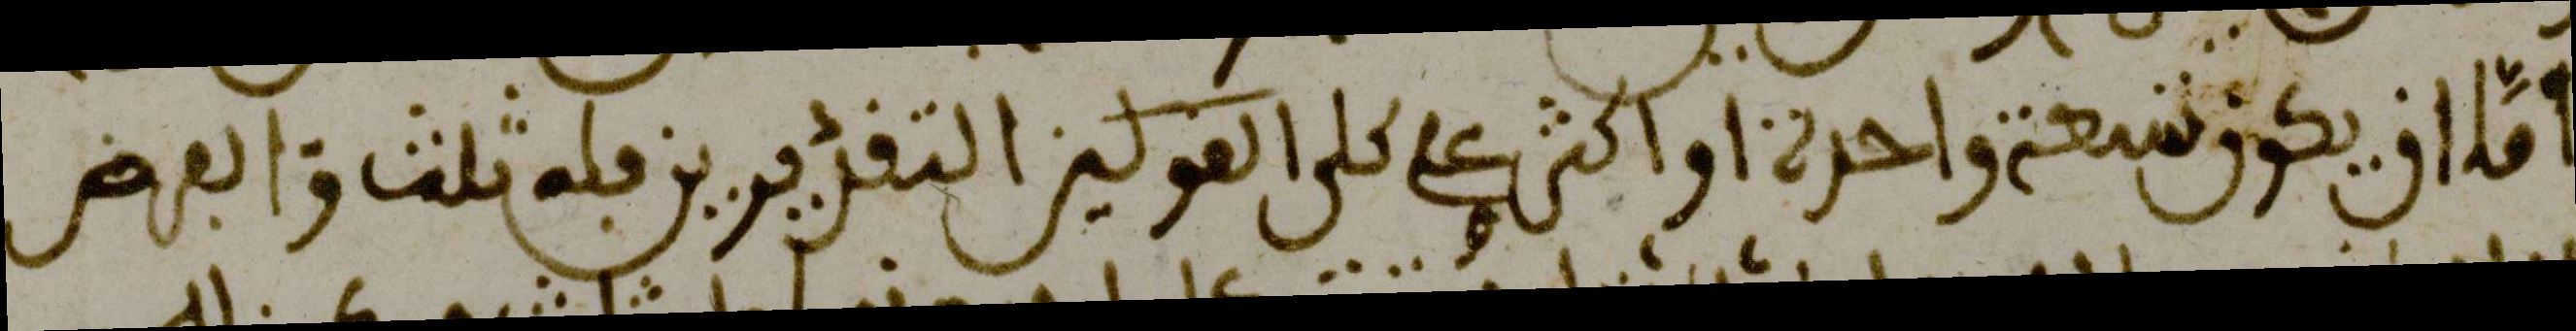امّا ان يكون تسعة واحدة او اكثر على كلى القولين التقديرين فله ثلث وَالفرض
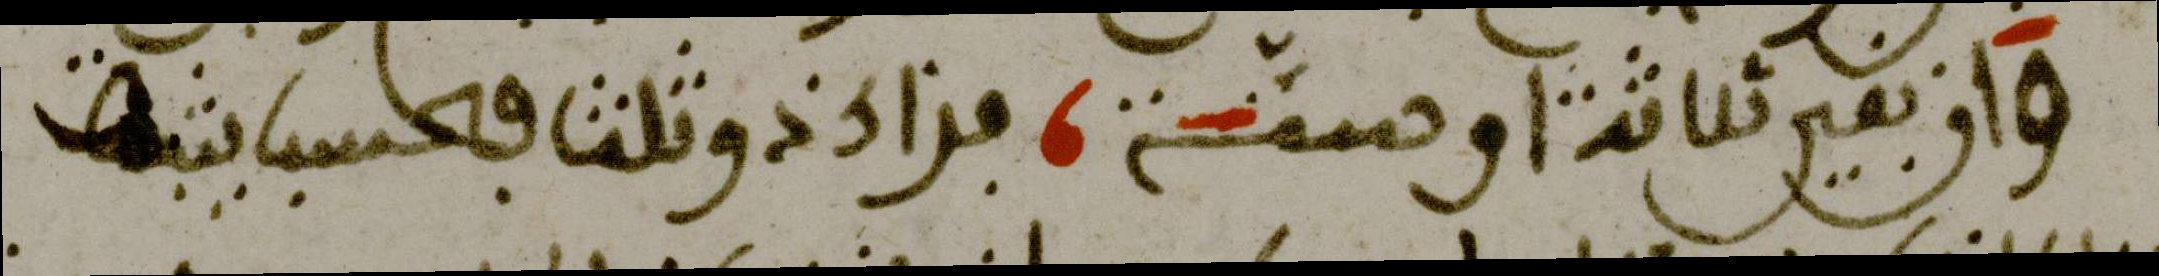وَان بقي ثلاثة او ستة فذاك ذو ثلث فحسب يثبت
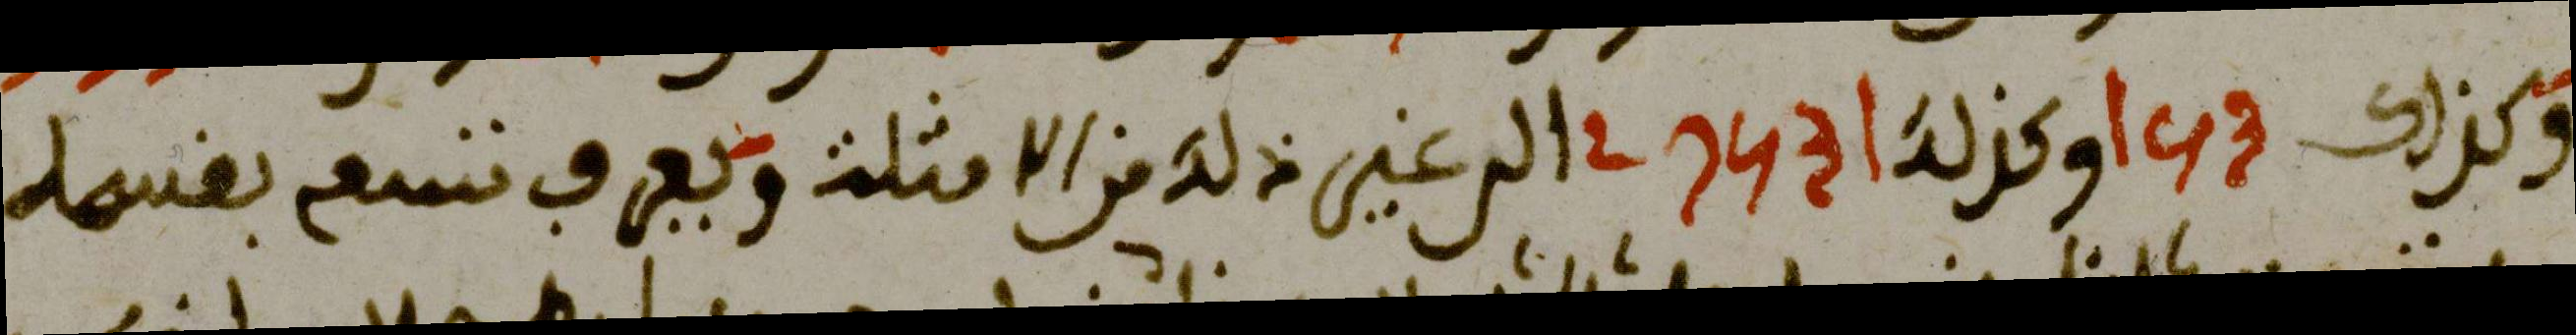وَكذلك 154 وكذلك 21531 الى غير ذلك من الامثلة وَيعرف تسعه بقسمه
